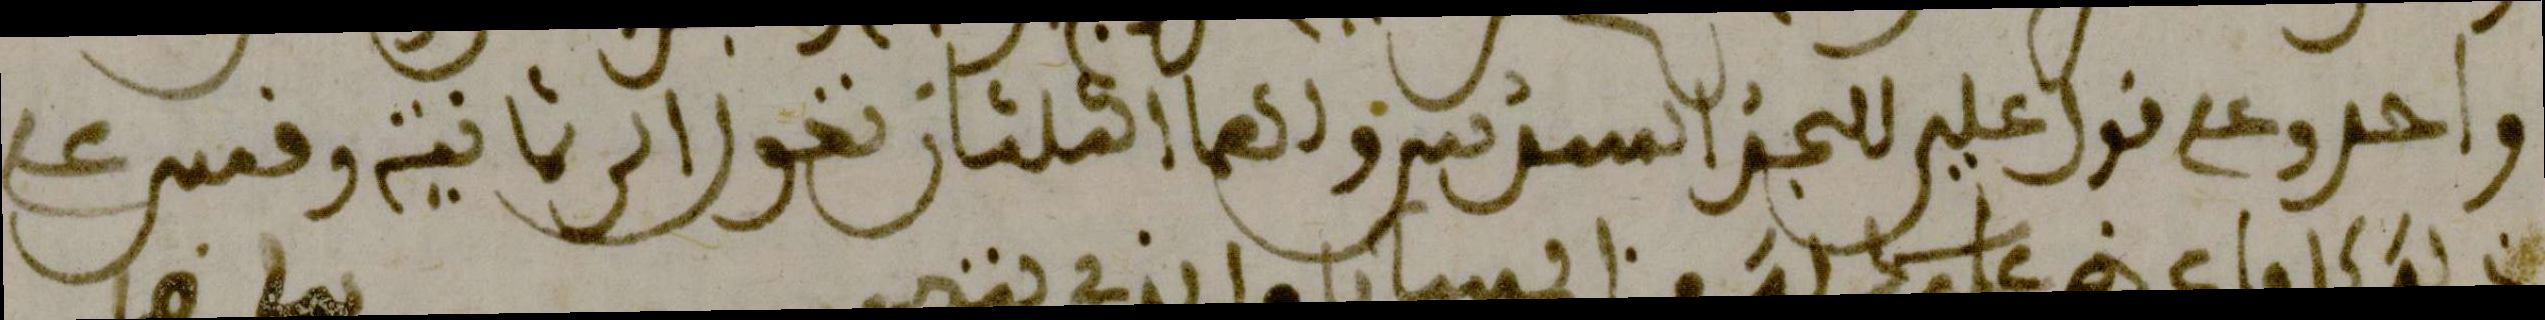واحد وعلى قول علي للجد السدس ولهما الثلثان تعول الى ثمانية وقس على
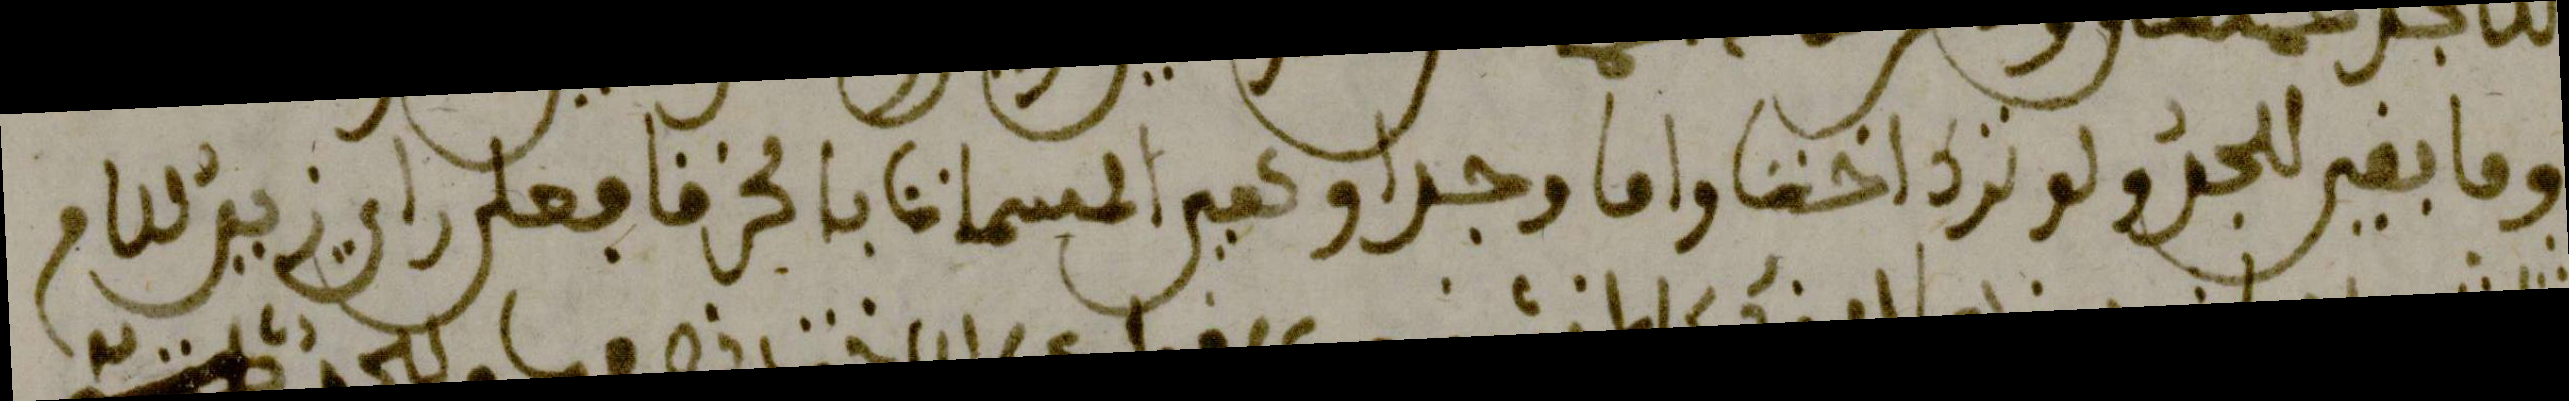وما بقي للجد ولو ترك اختا واما وجدا وهي المسمات بالخرقا فعلى راي زيد للام
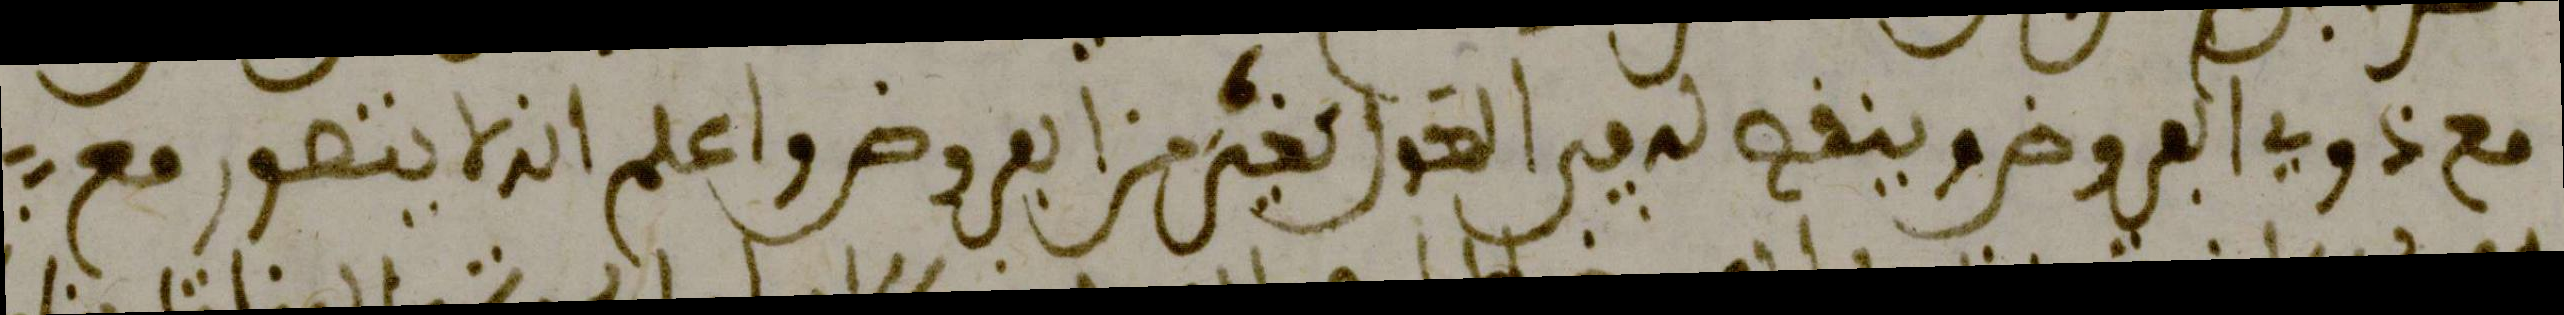مع ذوي الفروض وينقض له في العَول كغير من الفروض واعلم انه لا يتصور مع
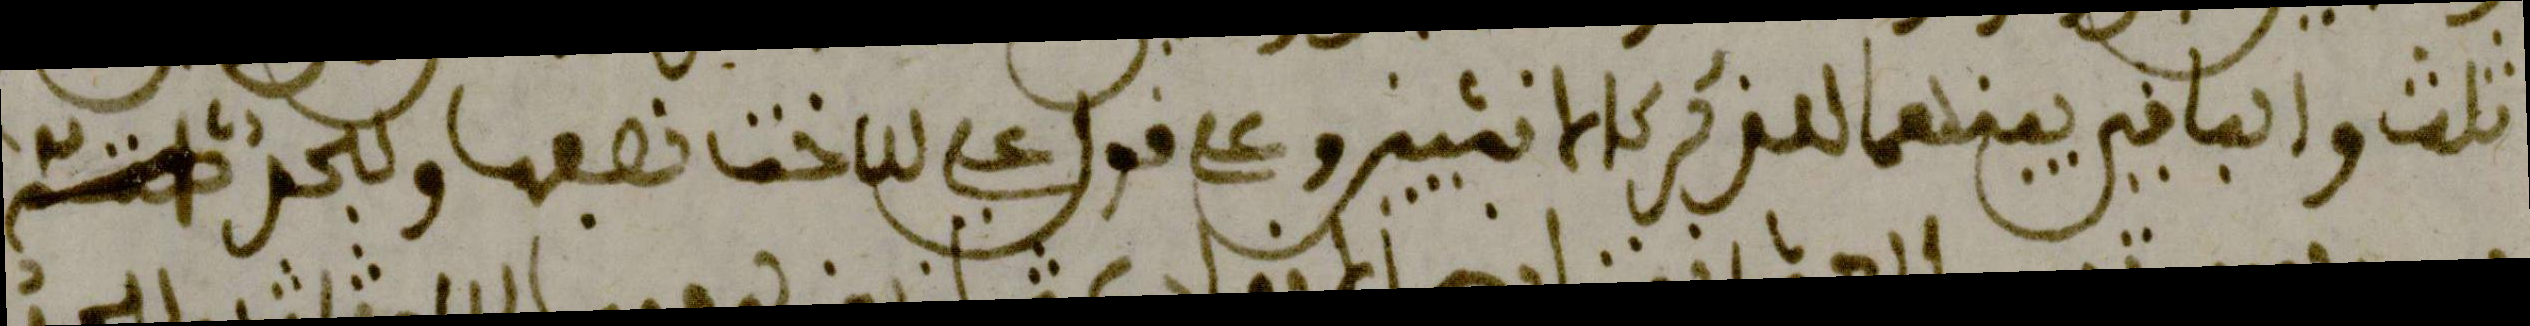ثلث والباقي بينهما للذكر كالانثيين وعلى قول علي للاخت نصفها وللجد #
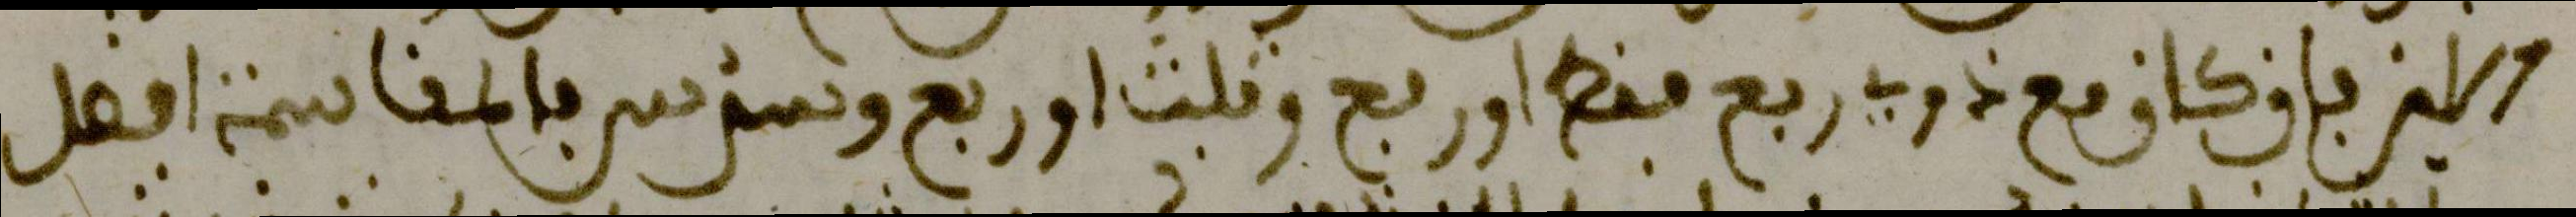الابن فان كان مع ذوي ربع فقط او ربع وثلث او ربع وسدس فالمقاسمة افضل
